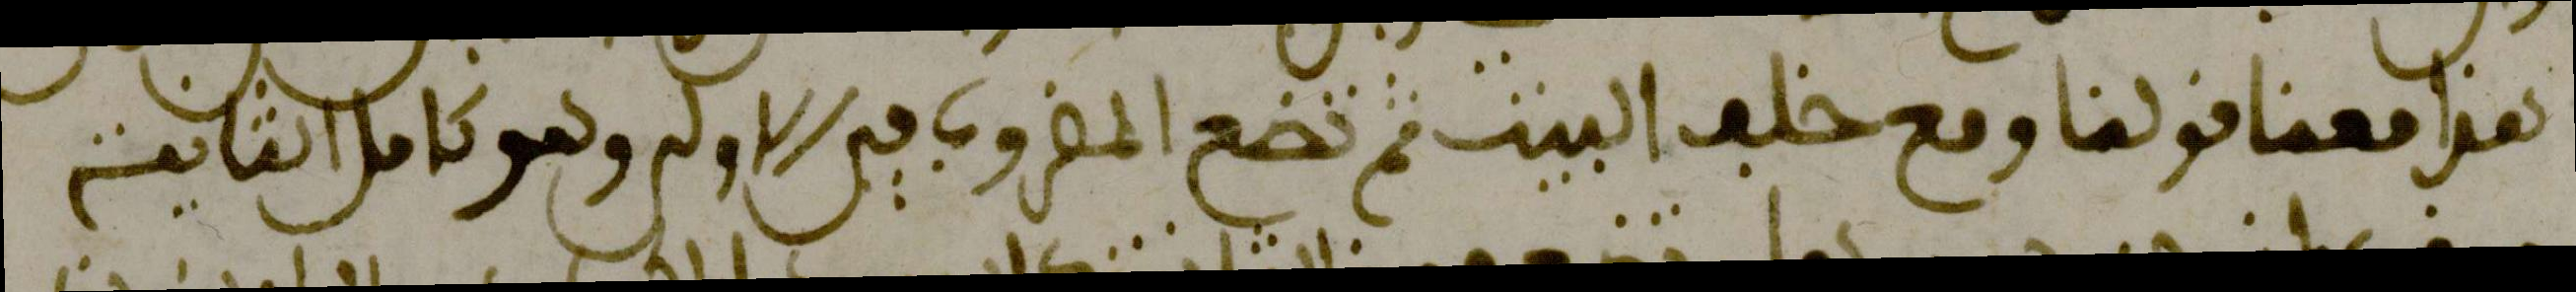هذا معنا قولنا ومع خلف البيت ثم تضع المضروب في الاولى وهو كامل الثانية
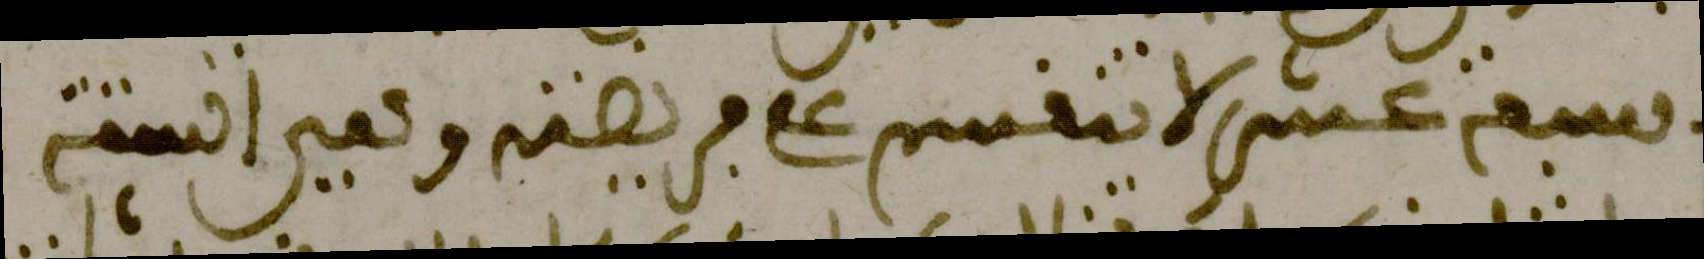سبعة عشر لا تنقسم على فريضته وهي الستة
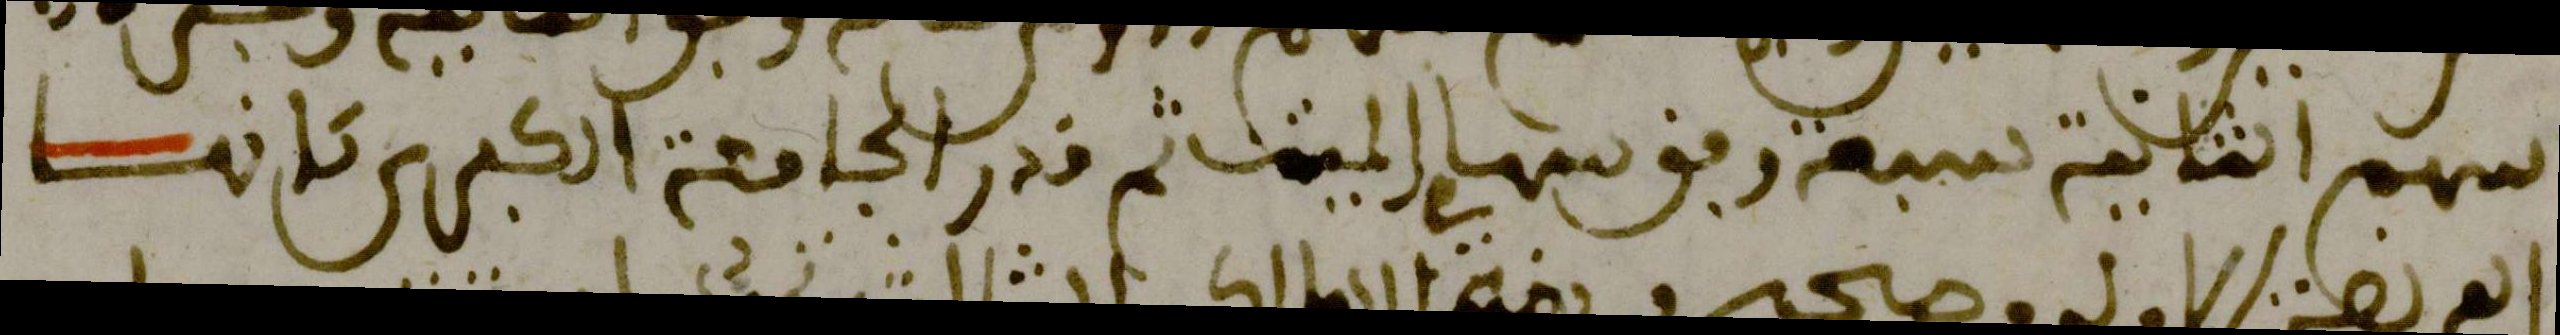سهم الثانية سبعة وفق سهام الميت ثم قدر الجامعة الكبرى كانهَا
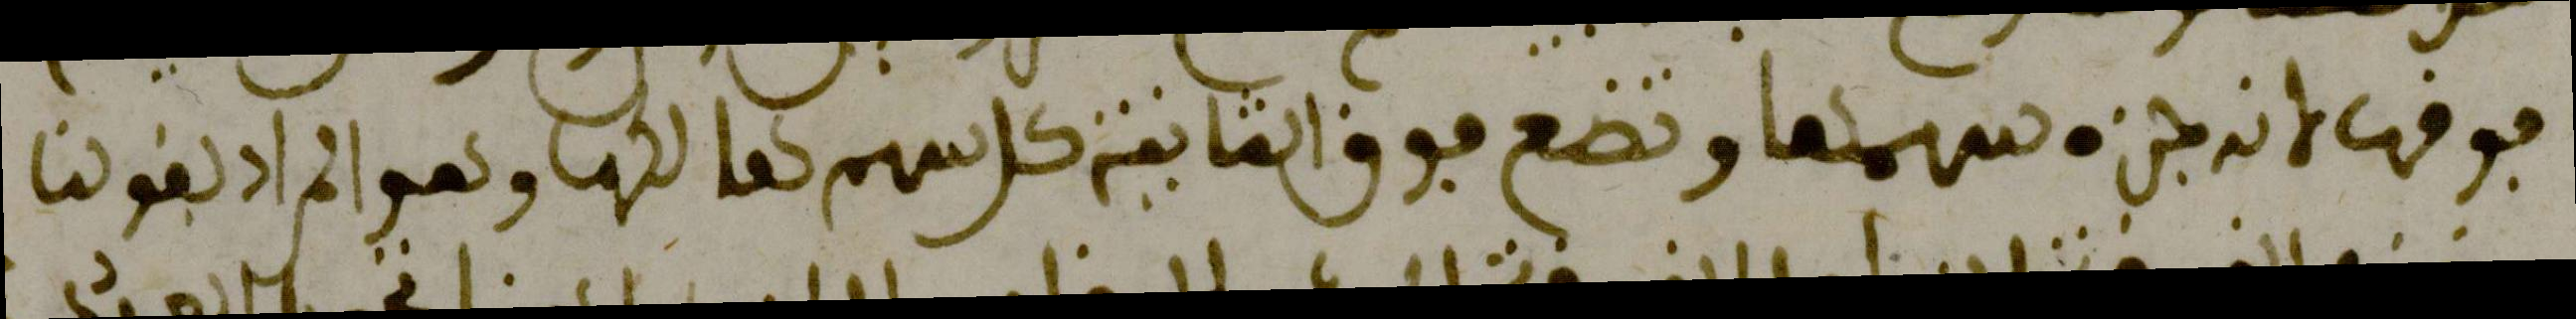فوقها لانه جزء سهمها وتضع فوق الثانية كل سهم هالكها وهو المراد بقولنا
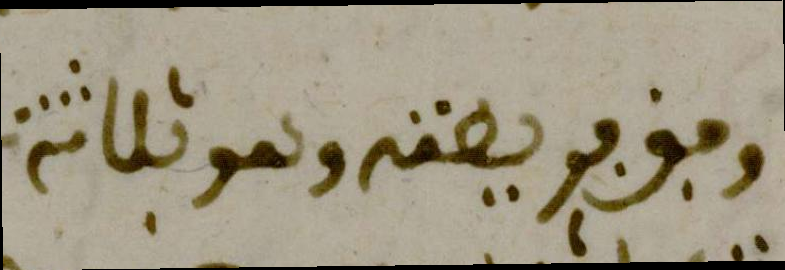وفق يضته وهو ثلاثة
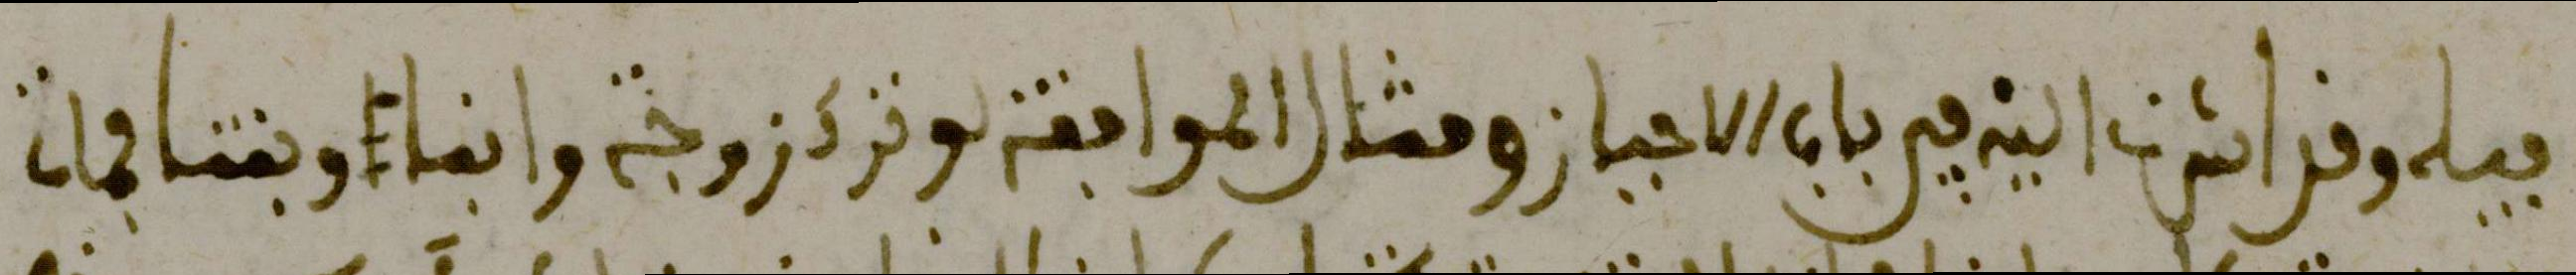فيه وقد اشرن اليه في باب الاحياز ومثال الموافقة لو ترك زوجة وابنا او بنتا فمات
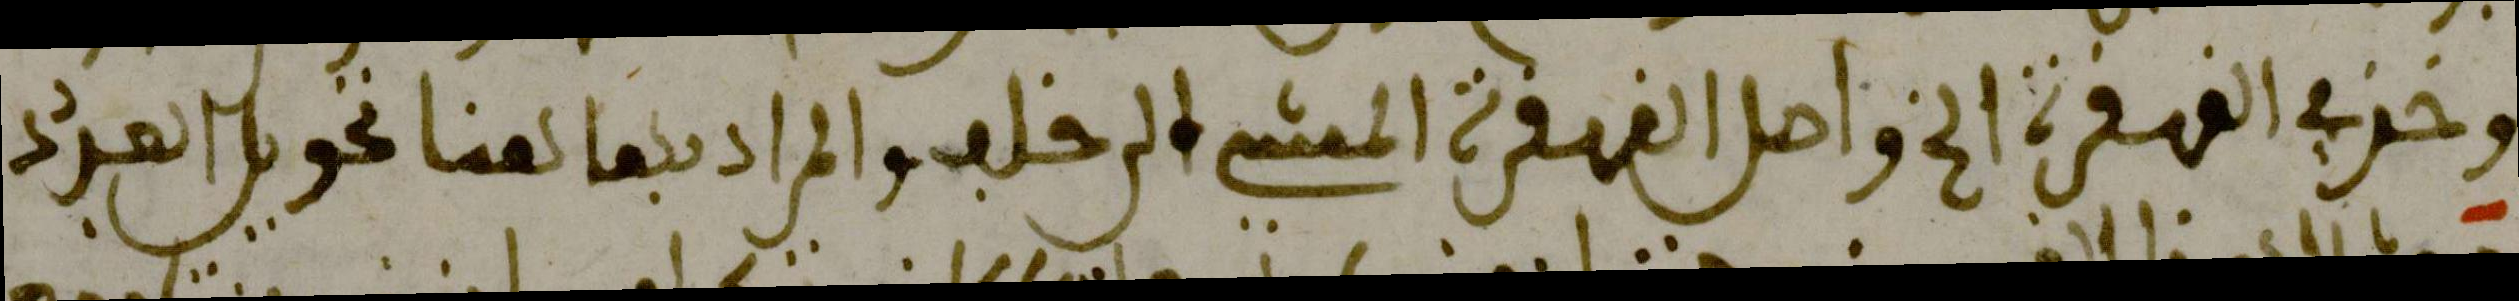وَخذ في القهقرة الخ واصل القهقرة المشي ءالى خلف والمراد بها هنا تحويل العدد
